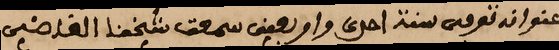عنوانه توفي سنة احدى واربعين سمعت شيخنا القاضي
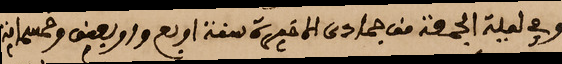وفي ليلة الجمعة من جمادى الاخيرة سنة اربع واربعين وخمسماية
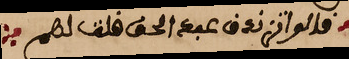قالوا تزندق عبد الحق قلت لهم
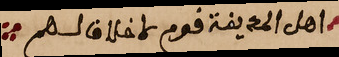اهل المدينة قوم لا خلاق لهم
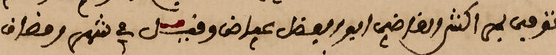توفي بمراكش القاضي ابو الفضل عياض وقيل في شهر رمضان
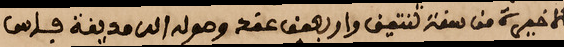الاخيرة من سنة ثنتين واربعين عند وصوله الى مدينة فاس
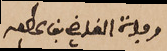وفاة القاضي بن عطيه
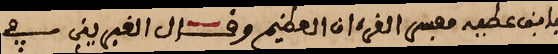بابن عطيه مفسر القرءان العظيم وقال الغبريني في
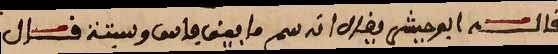قال ابو حيشر يقال انه سم ما بين فاس وسبتة قال
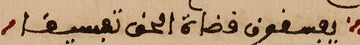يفسقون قضاة الحق تفسيقا
